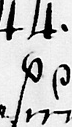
d.
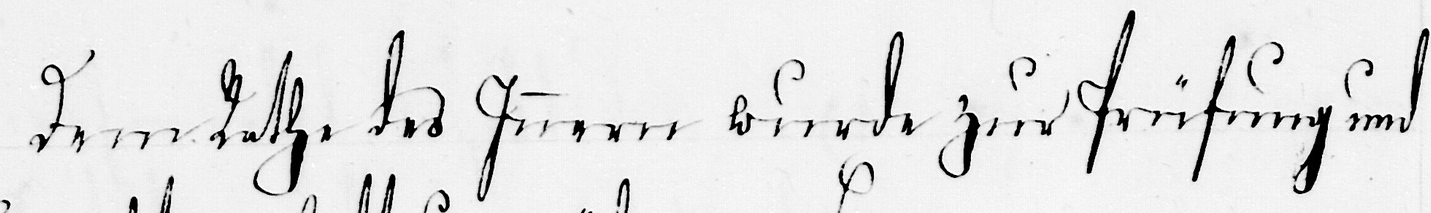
Dem Rathe des Innern wurde zur Prüfung und
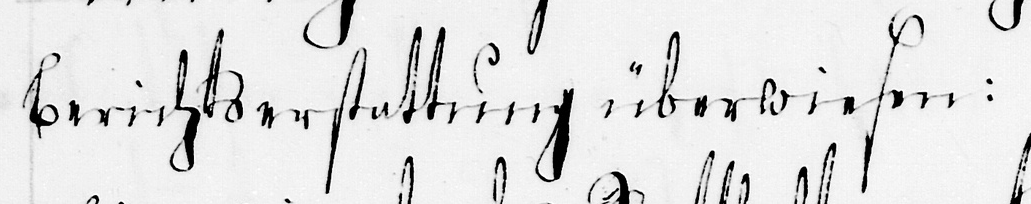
Berichtserstattung überwiesen:
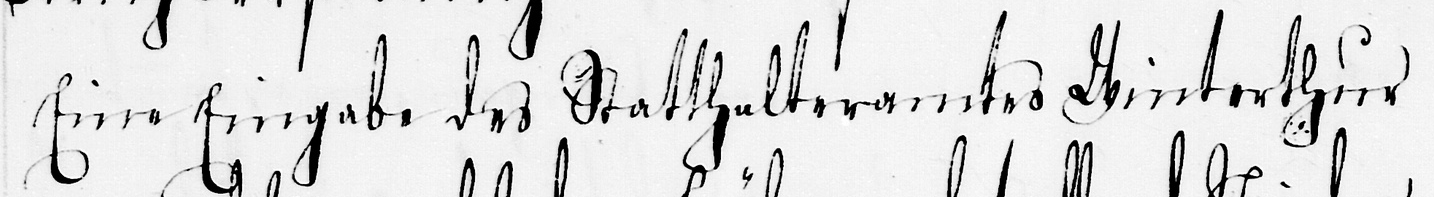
Eine Eingabe des Statthalteramtes Winterthur
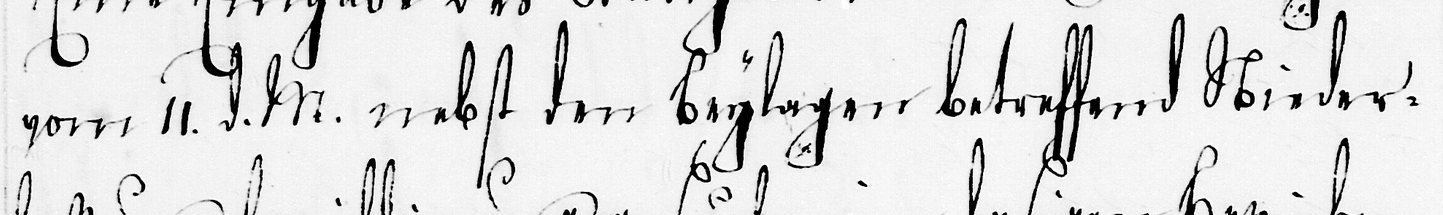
vom 11. d. M. nebst den Beylagen betreffend Nieder¬
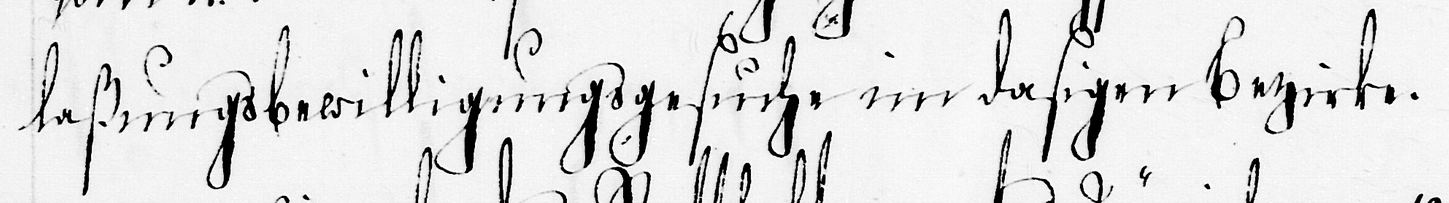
laßungsbewilligungsgesuche im dasigen Bezirke.
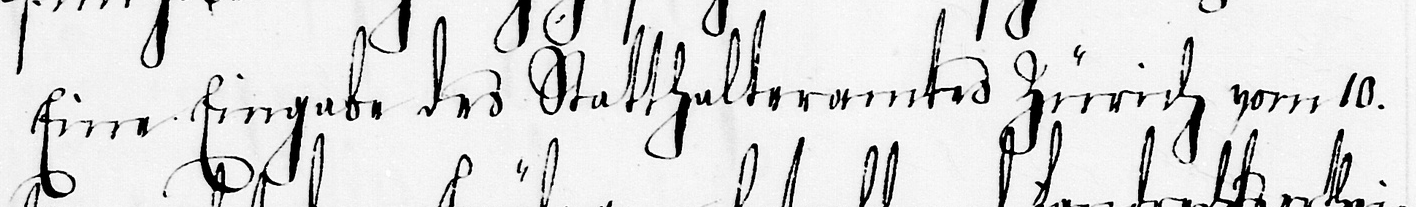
Eine Eingabe des Statthalteramtes Zürich vom 10.
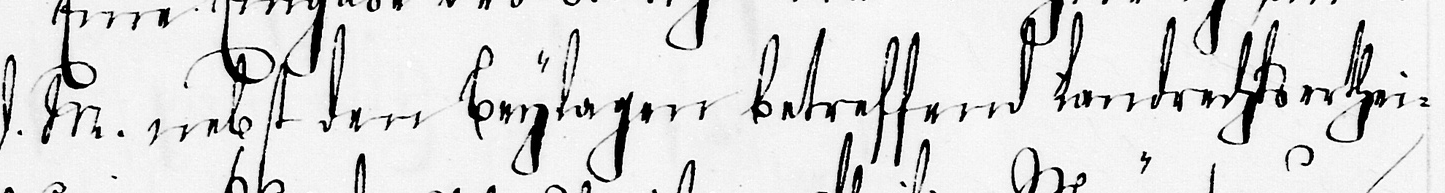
M. nebst den Beylagen betreffend Landrechtserthei¬
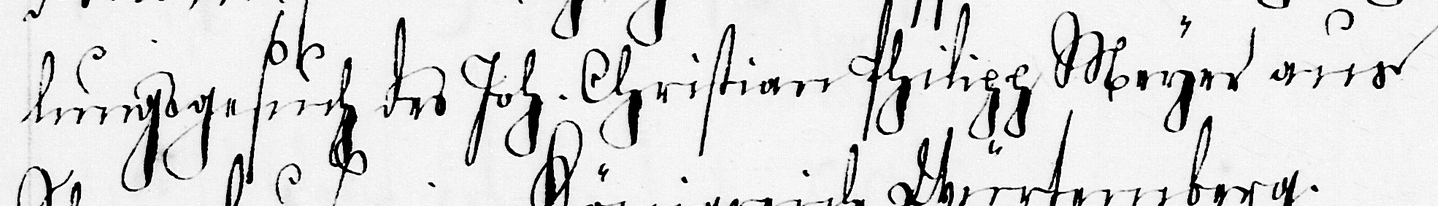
lungsgesuch des Joh. Christian Philipp Meyer aus
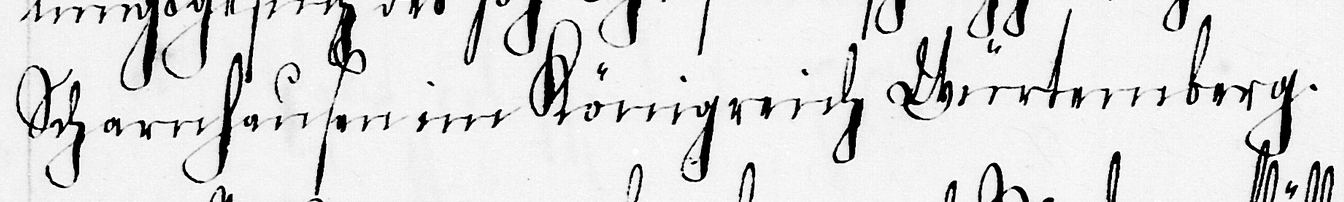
Scharnhausen im Königreich Würtemberg.
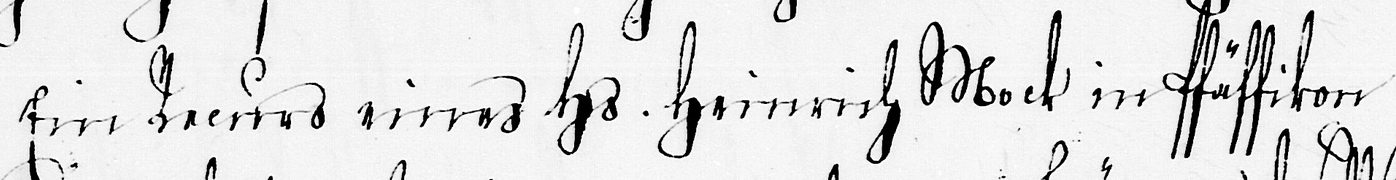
Ein Recurs eines Hs. Heinrich Mock in Pfäffikon
